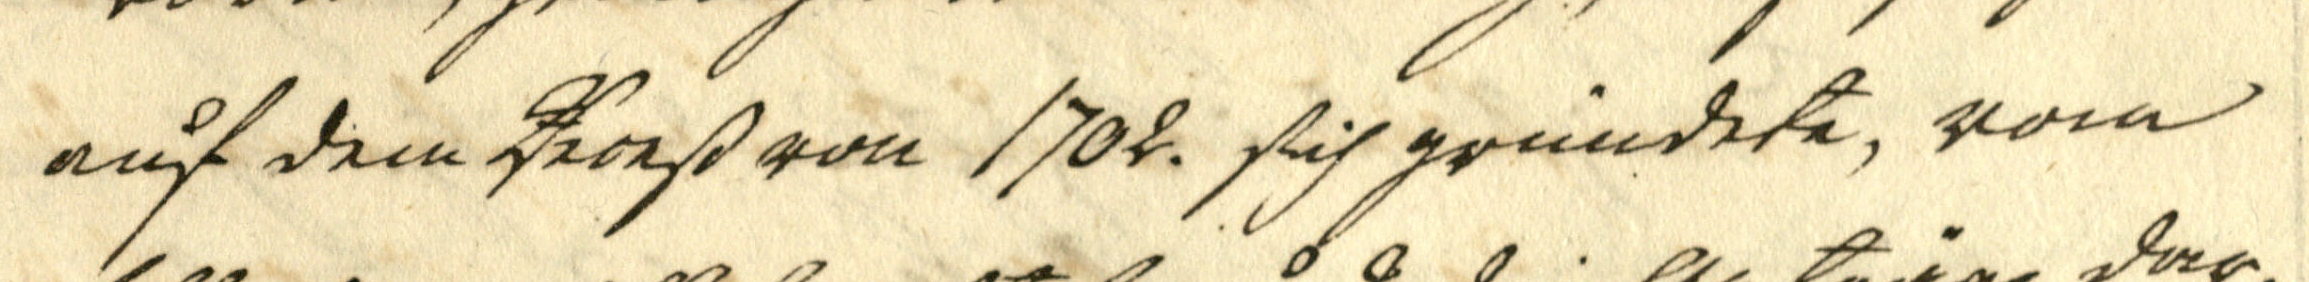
auf dem Receß von 1702. sich gründete, vom
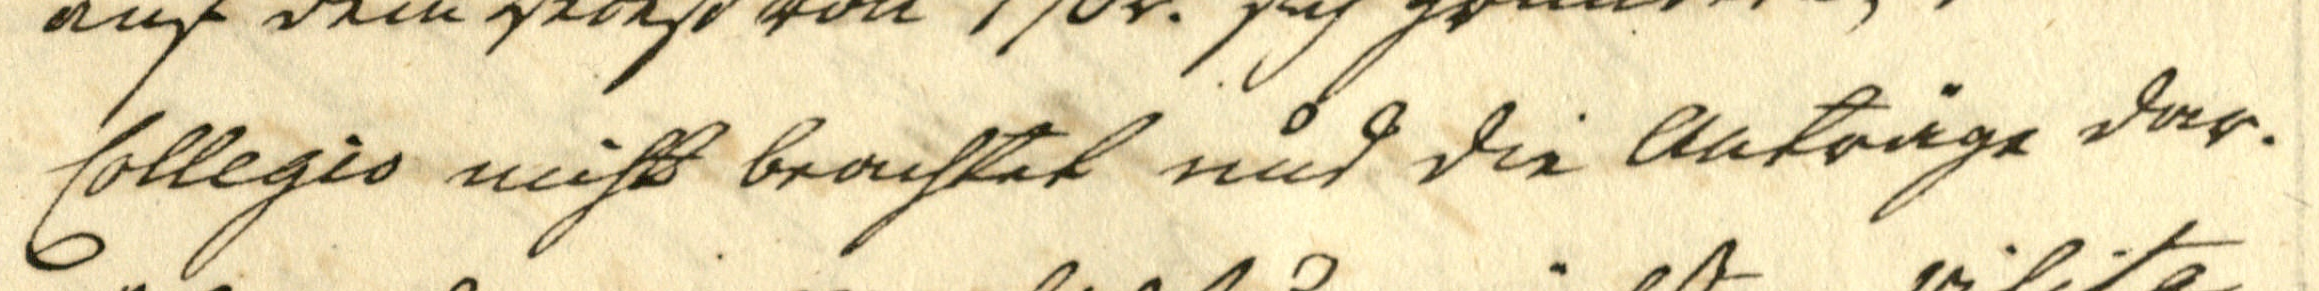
Collegio nicht beachtet und die Anträge dar¬
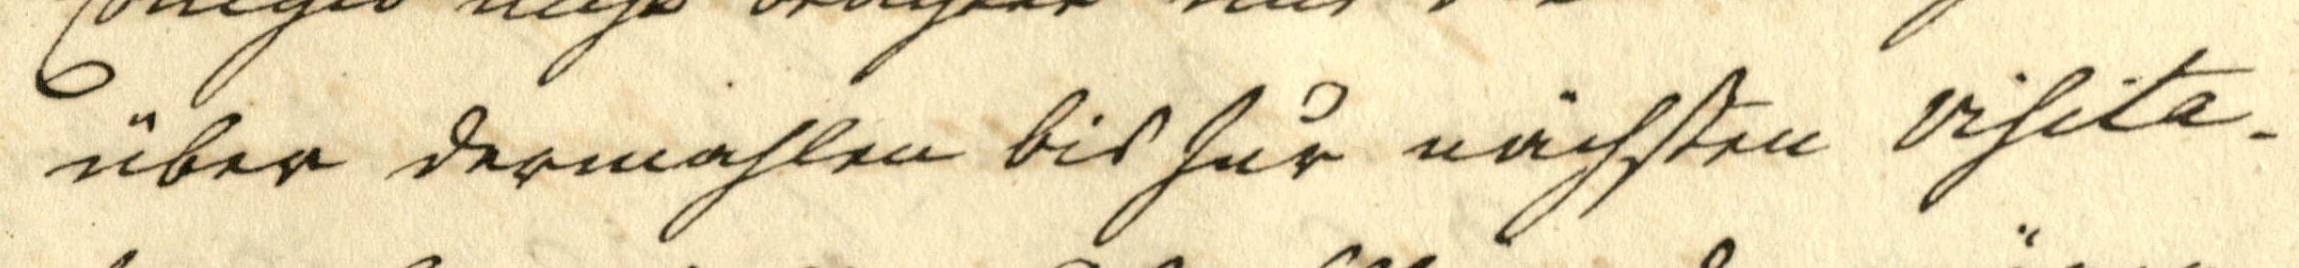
über dermahlen bis zur nächsten Visita¬
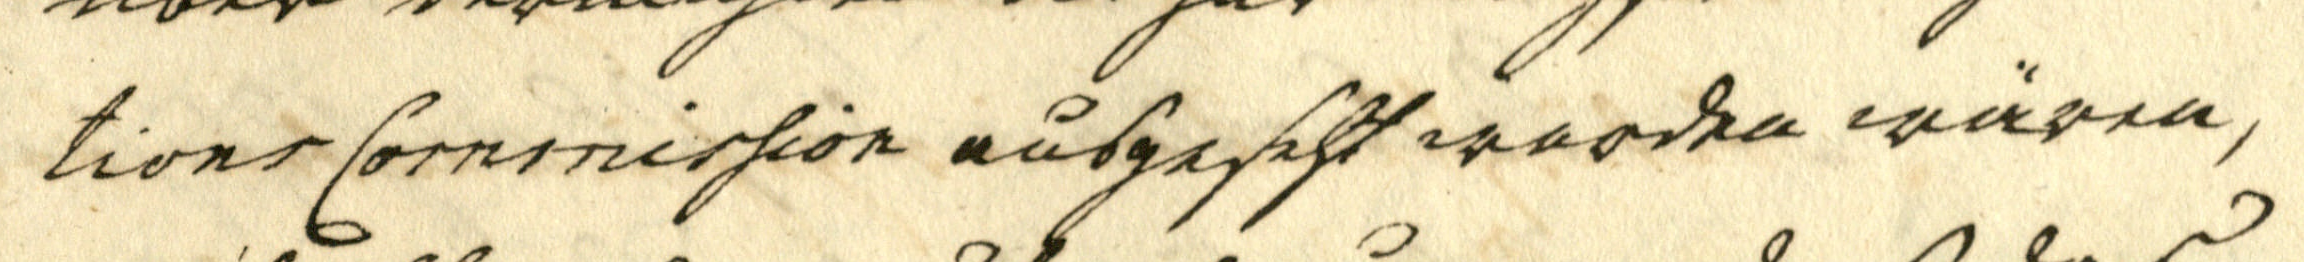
tions Commission ausgesetzt worden wären,
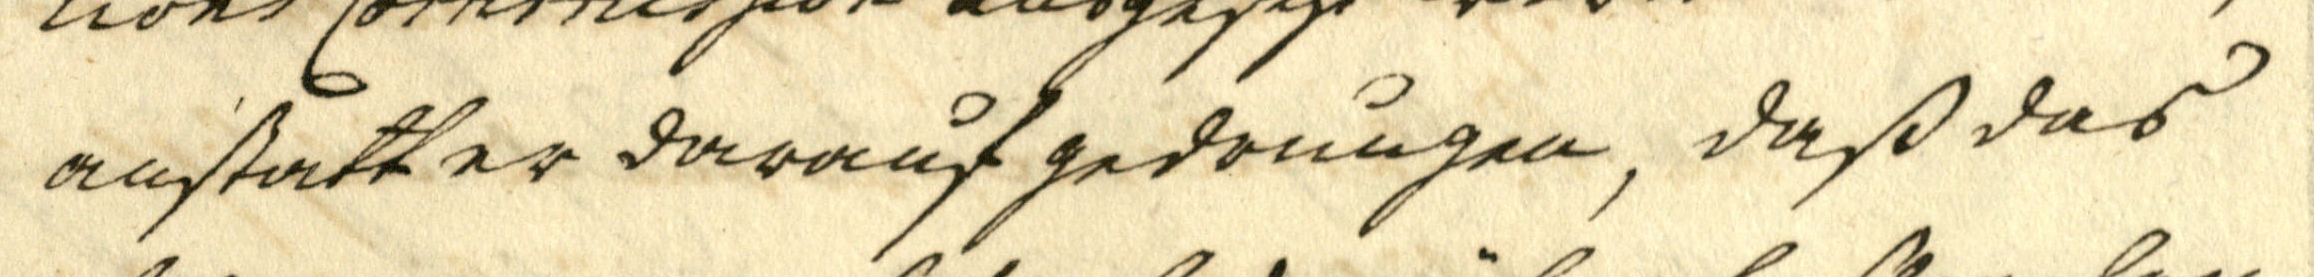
anstatt er darauf gedrungen, daß das
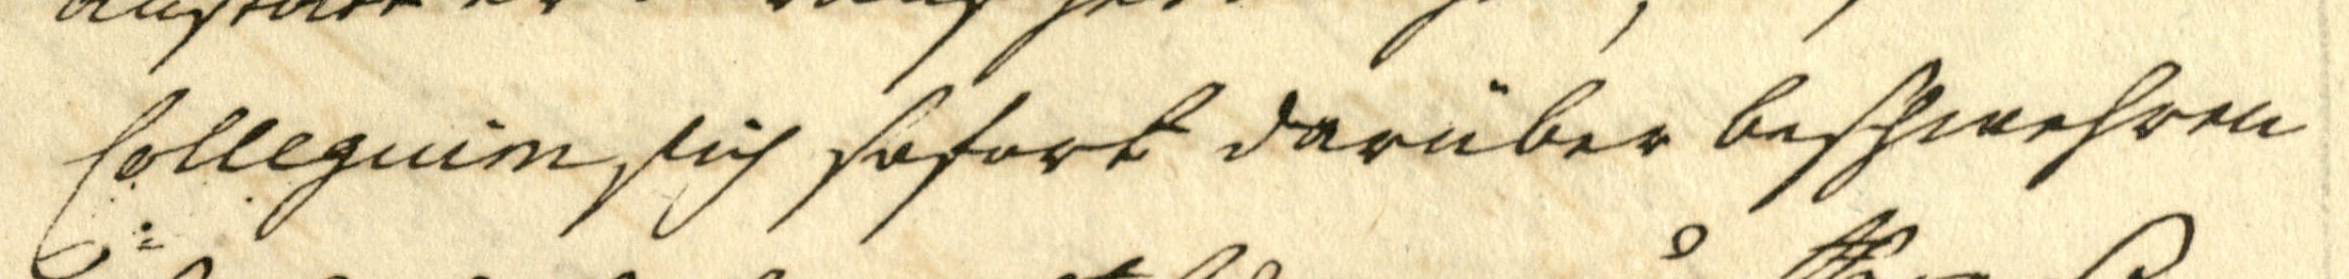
Collegium sich sofort darüber beschwehren
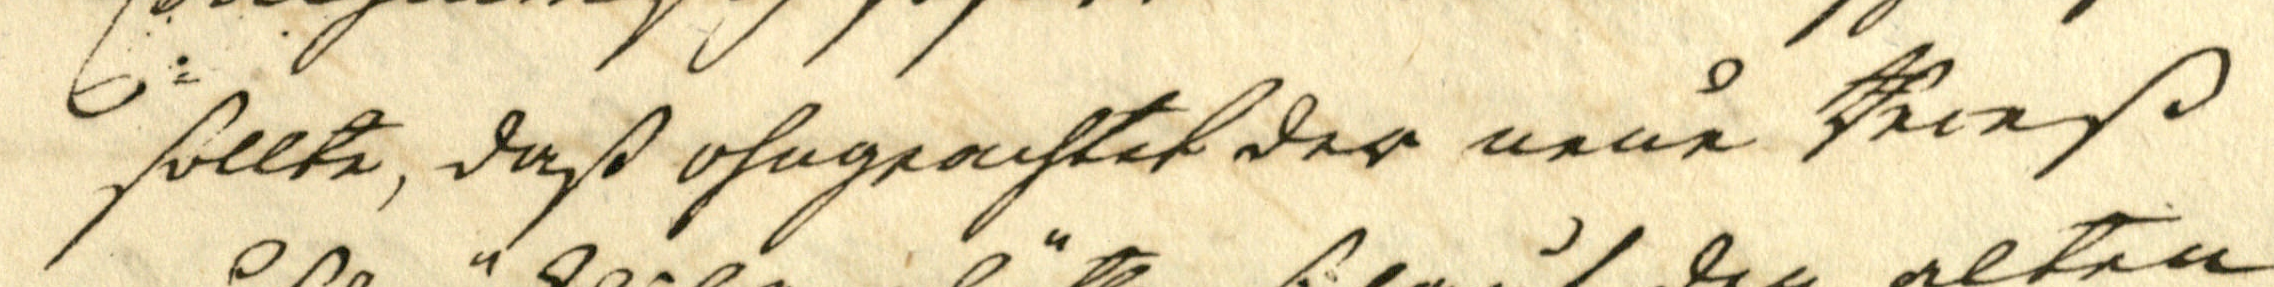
sollte, daß ohngeachtet der neue Receß
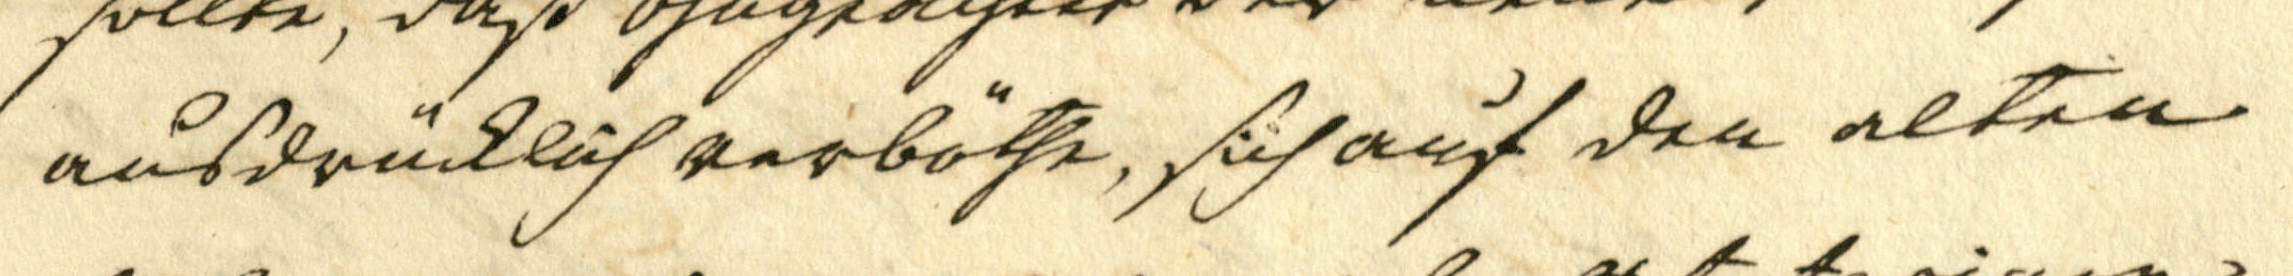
ausdrücklich verböthe, sich auf den alten
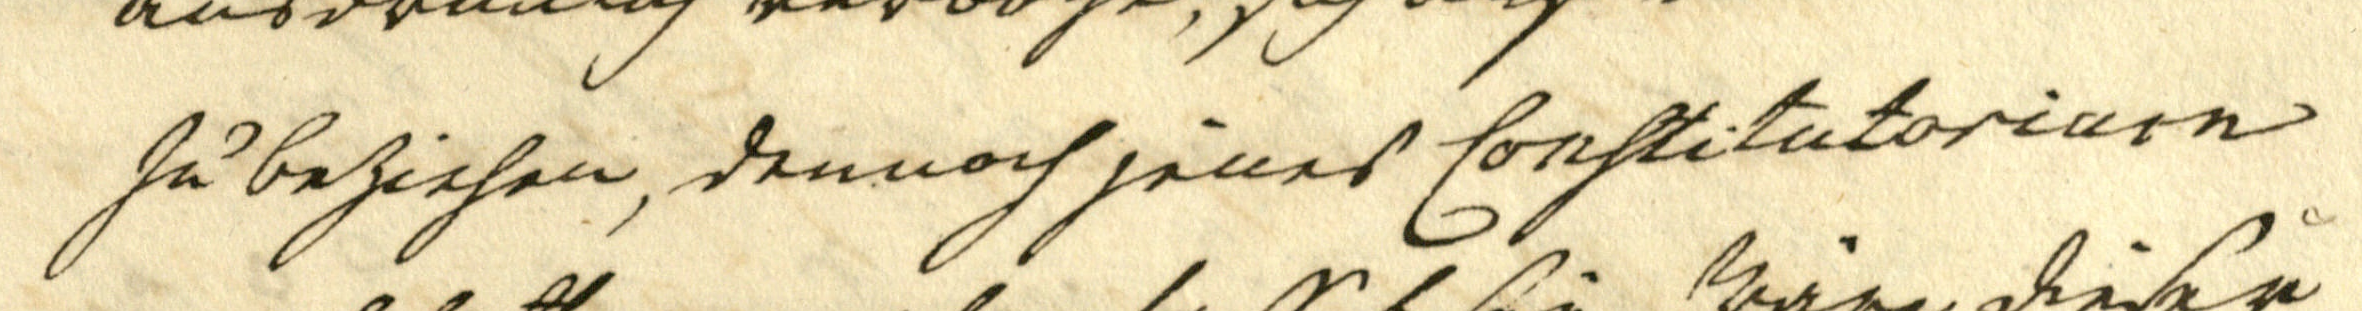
zu beziehen, dennoch jenes Constitutorium
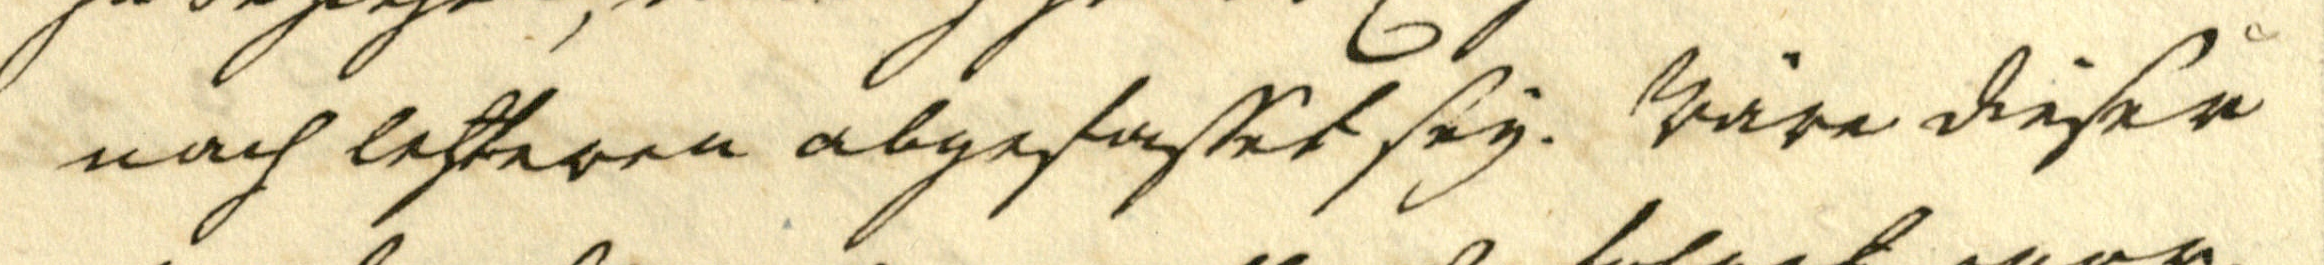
nach letzteren abgefasset seÿ. Wäre dieser
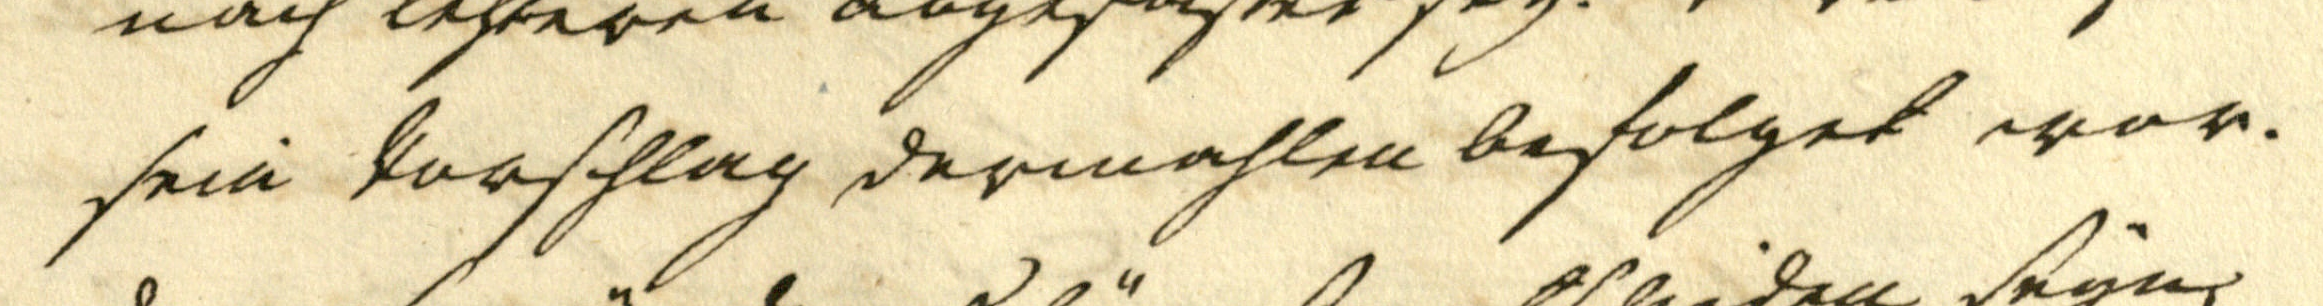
sein Vorschlag dermahlen befolget wor¬
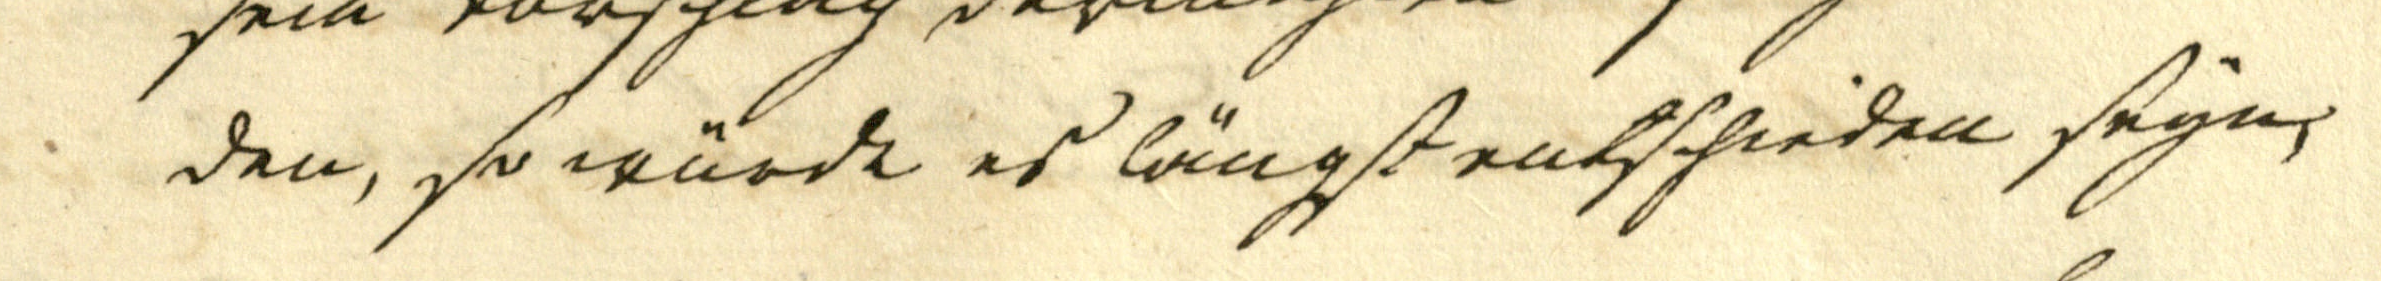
den, so würde es längst entschieden seÿn,
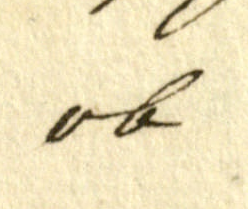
ob
